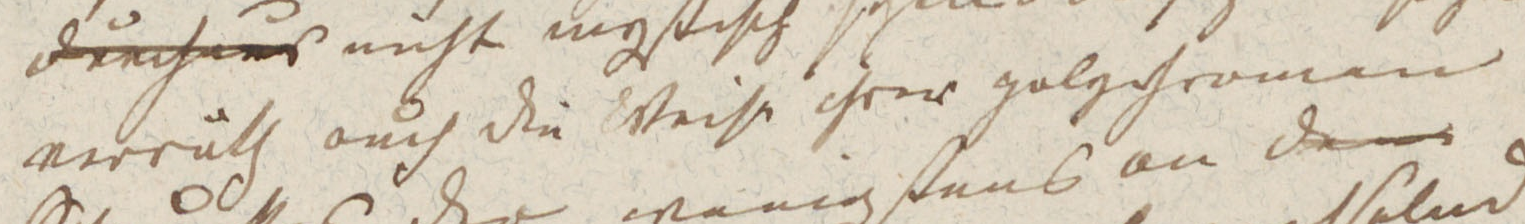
verräth auch die Weise ihrer polychromen
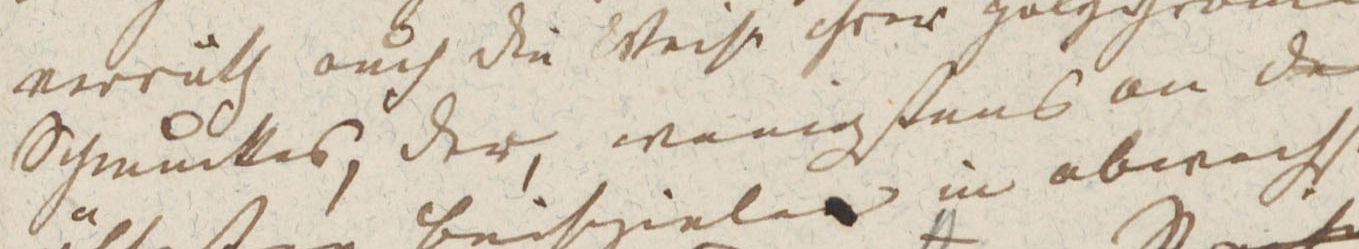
Schmuckes, der, wenigstens an den
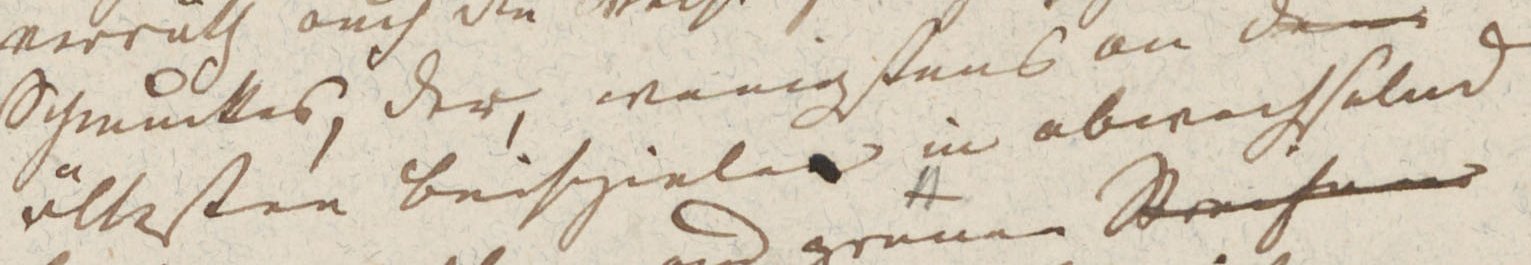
ältesten Beispielen in abwechselnd
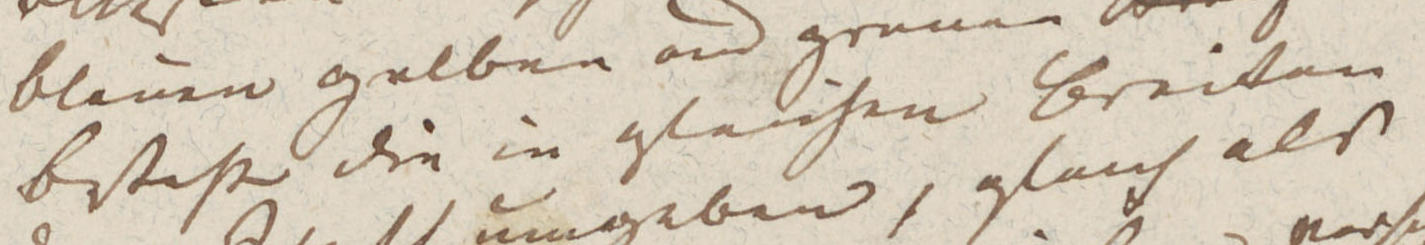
besteht die in gleichen Breiten
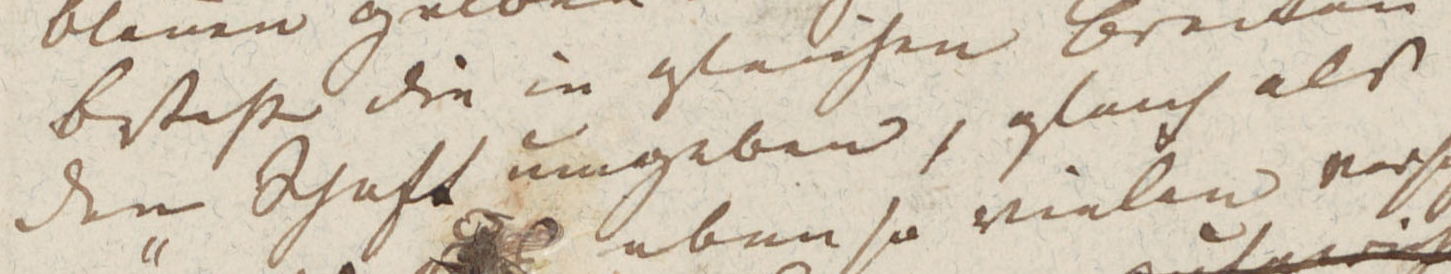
den Schaft umgeben, gleich als
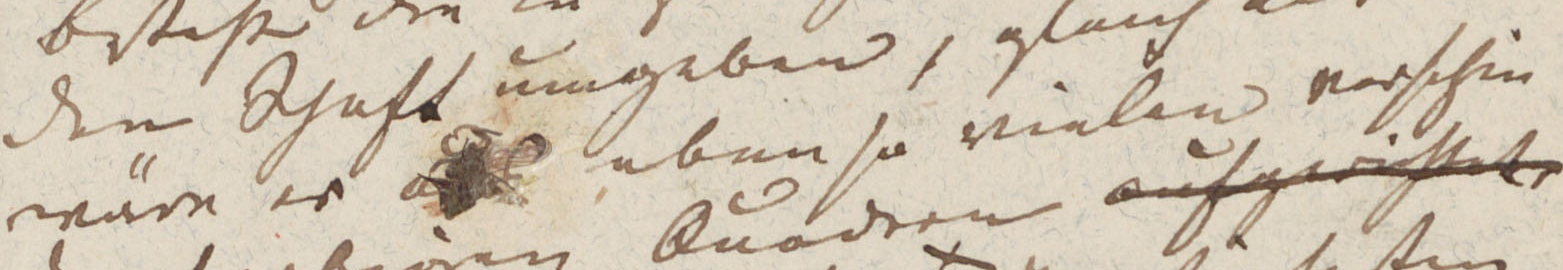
wäre er aus eben so vielen verschie
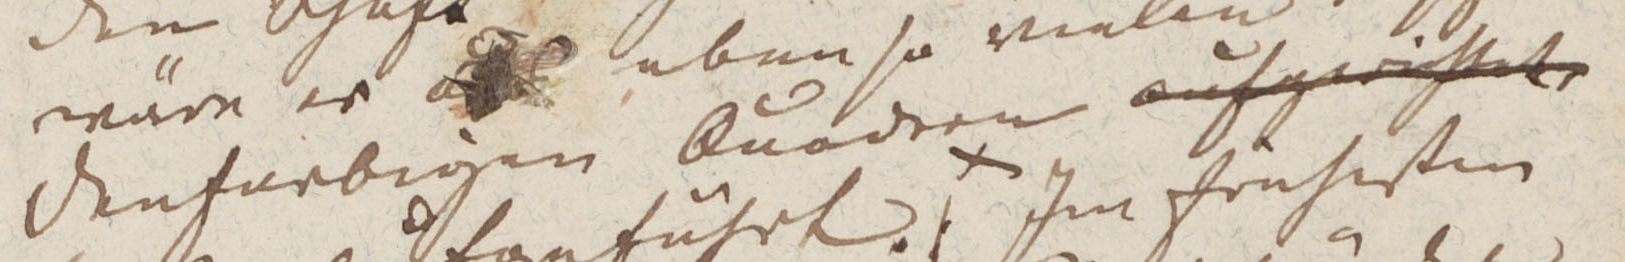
denfarbigen Quadern aufgerichtet,
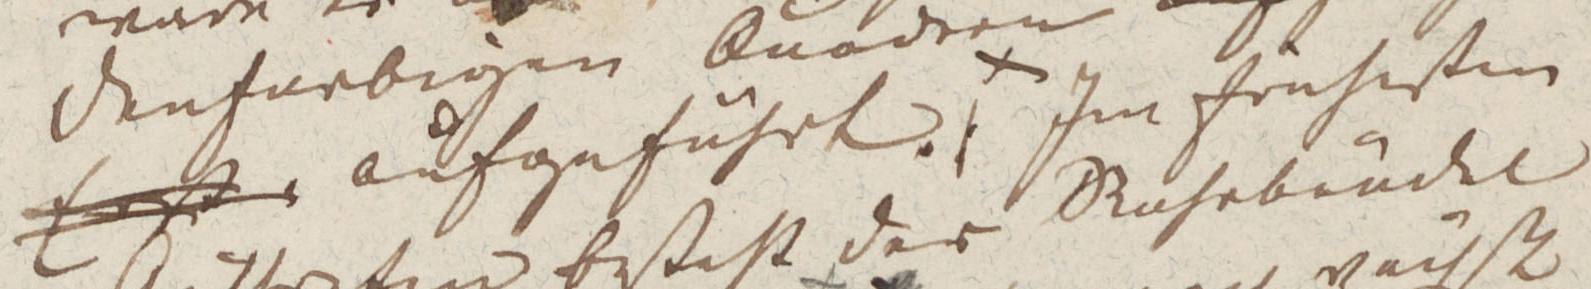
Erst aufgeführt. : % Im frühesten
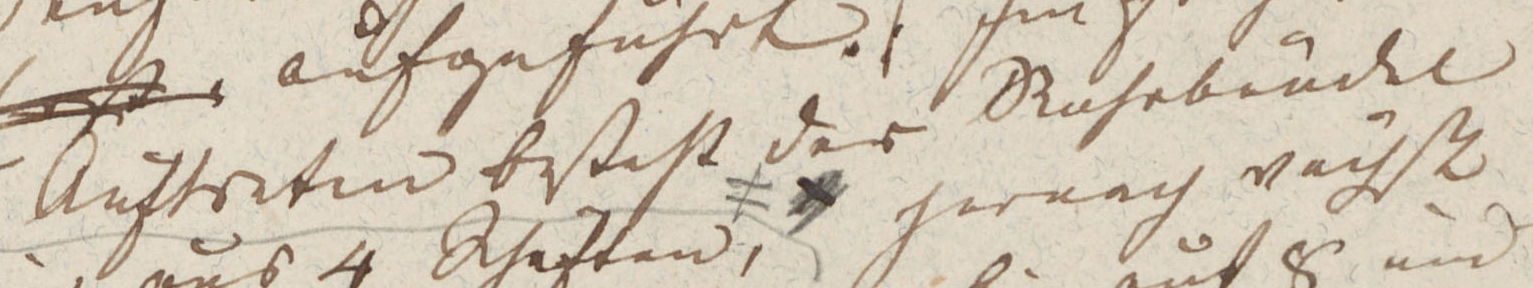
Auftreten besteht der Rohrbündel
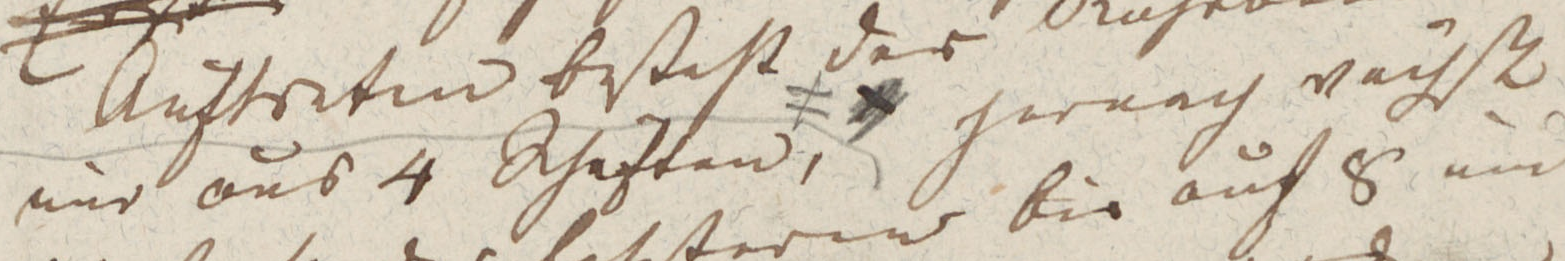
nur aus 4 Schäften,% % hernach wächst
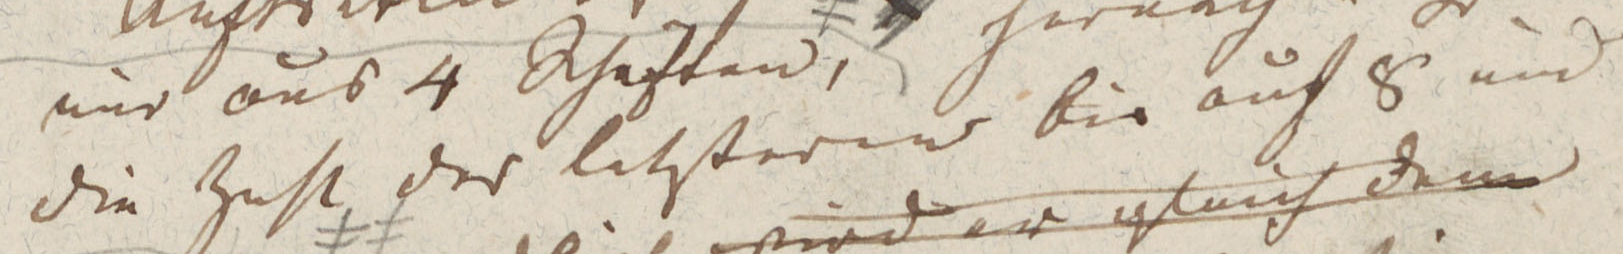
die Zahl der letzteren bis auf 8 und
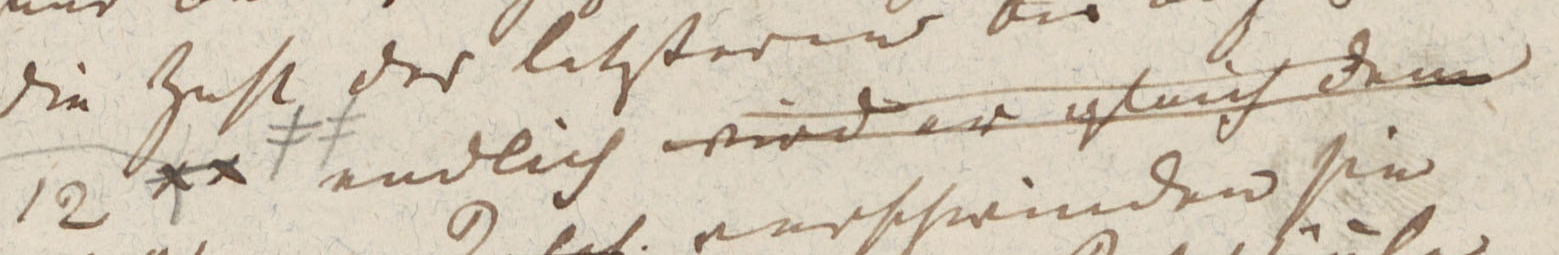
12 % % endlich wird er gleich dem
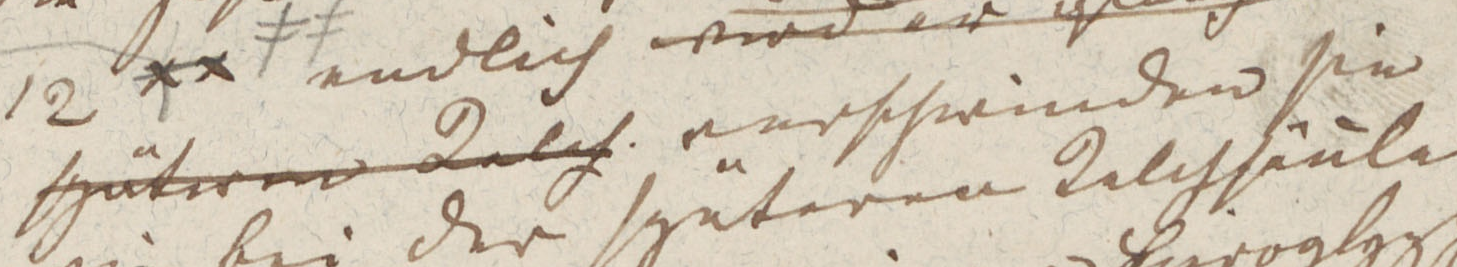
späteren Kelch verschwinden sie
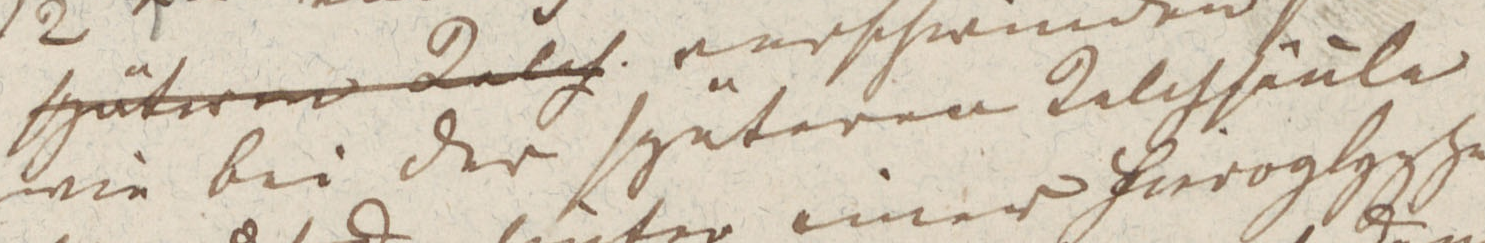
wie bei der späteren Kelchsäule
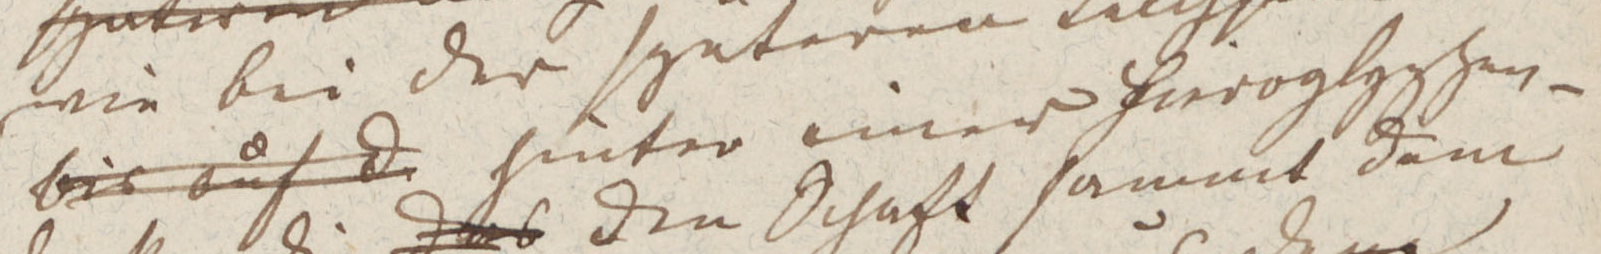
bis auf d hinter einer hHieroglyphen-
